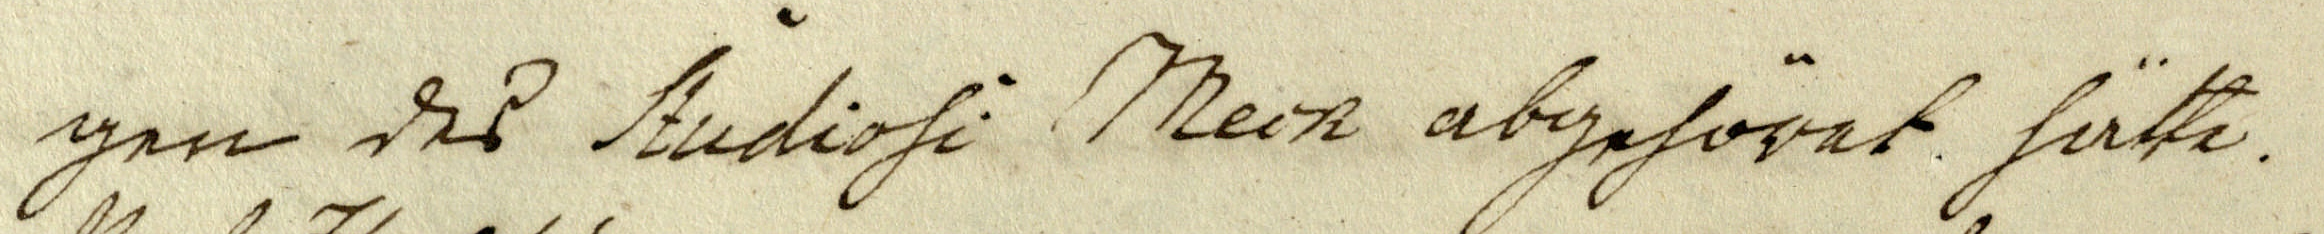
gen des Studiosi Meck abgehöret hätte.
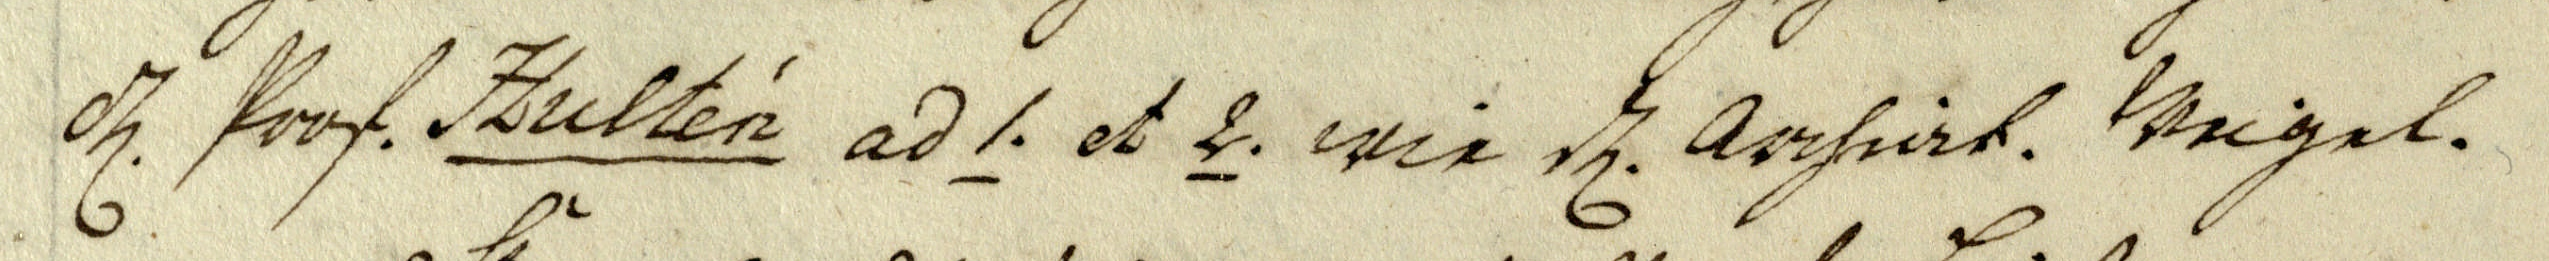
dh. Prof. Hultén ad 1. et 2. wie dh. Archiat. Weigel.
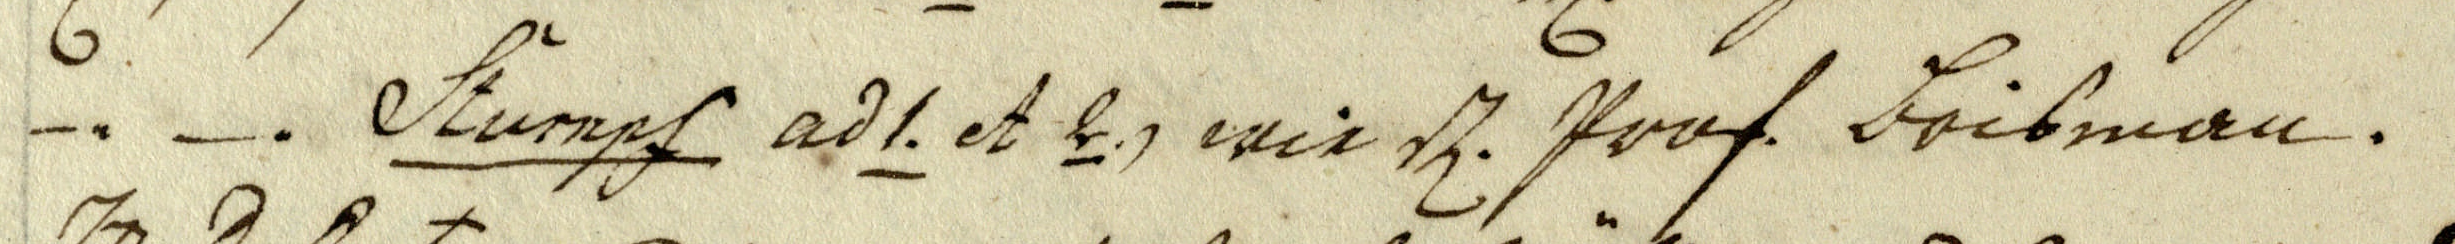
Stumpf ad 1. et 2., wie dh. Prof. Brisman
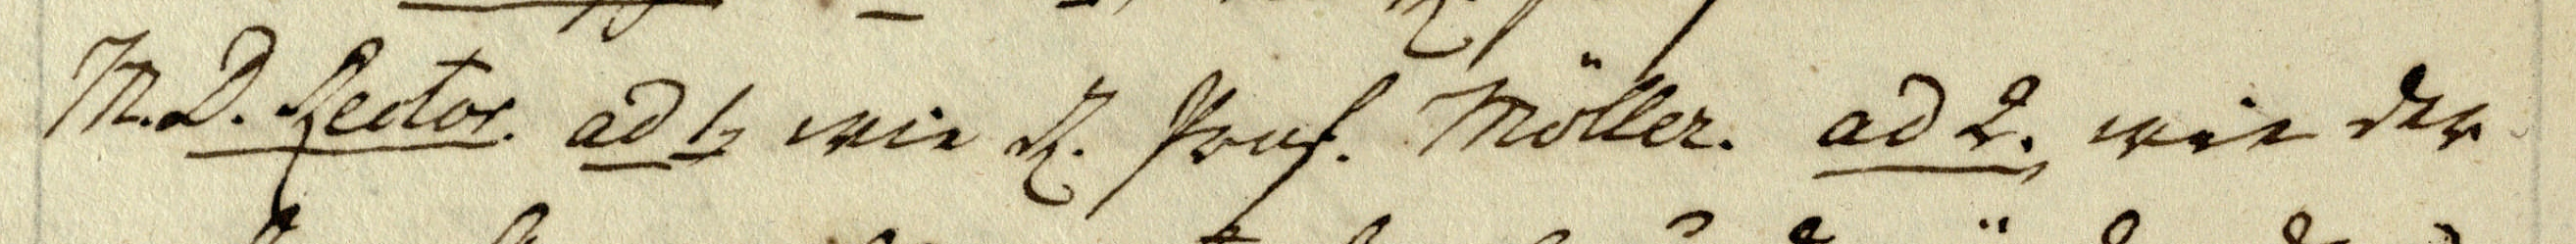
M. D. Rector. ad 1. wie dh. Prof. Möller. ad 2., wie der
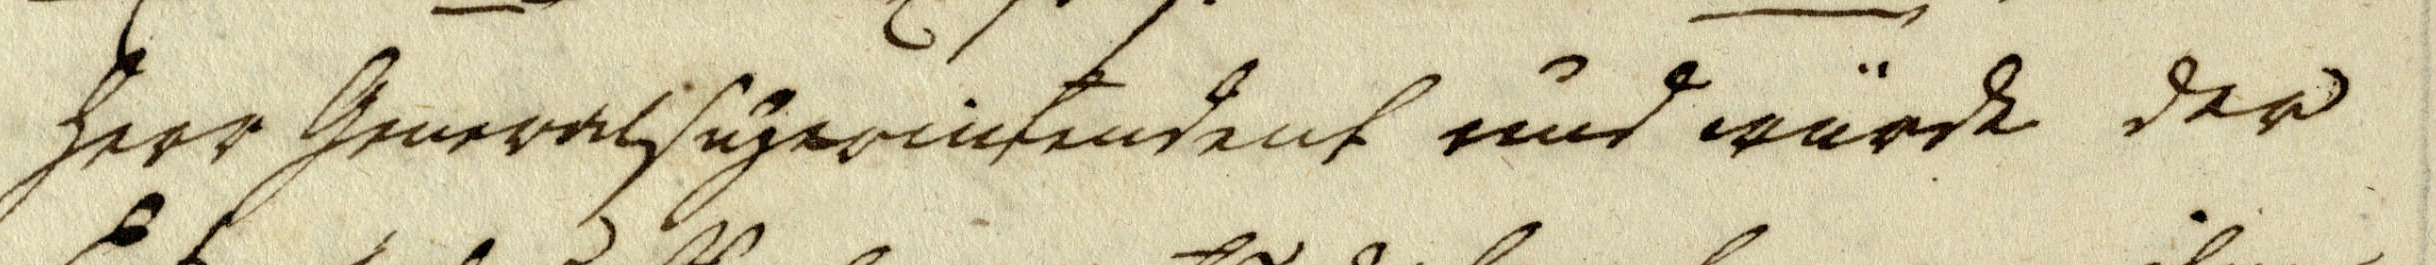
Herr Generalsuperintendent und würde der
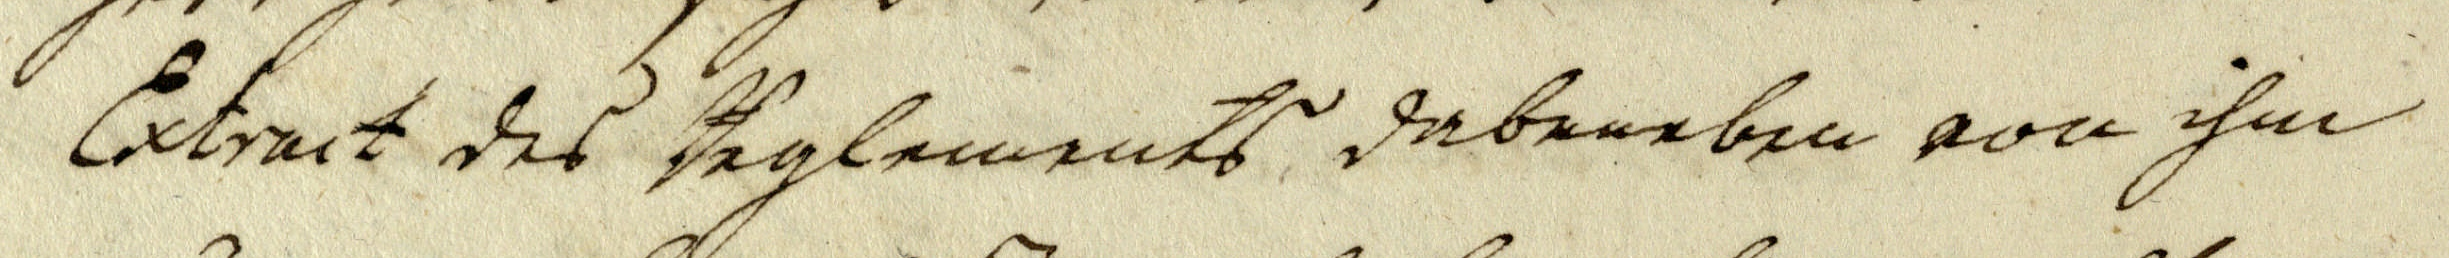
Extract des Reglements dabeneben von ihm
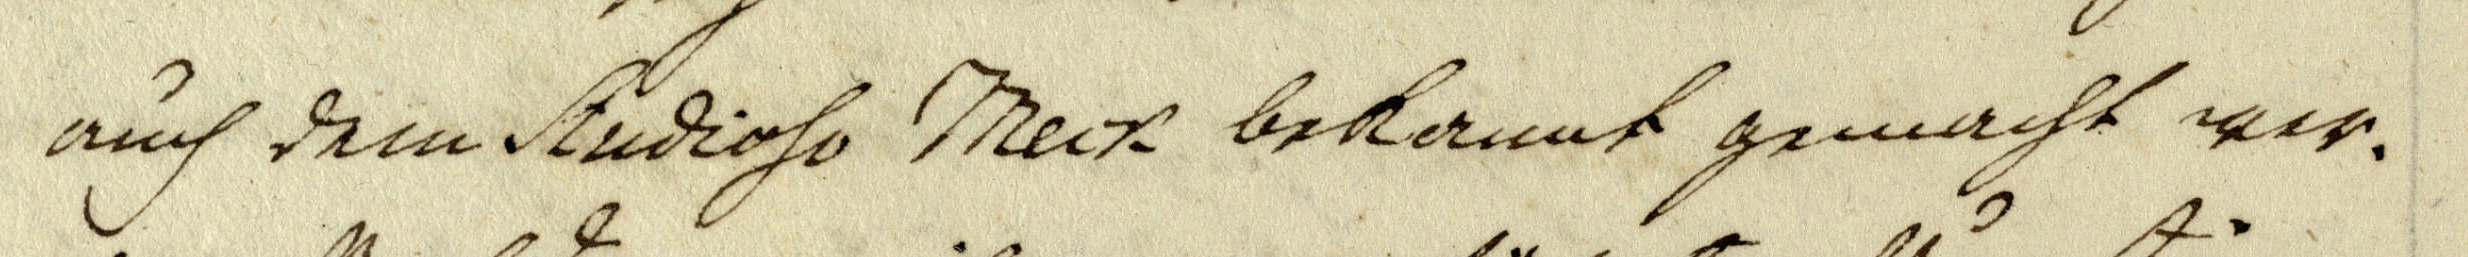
auch dem Studioso Meck bekannt gemacht wer¬
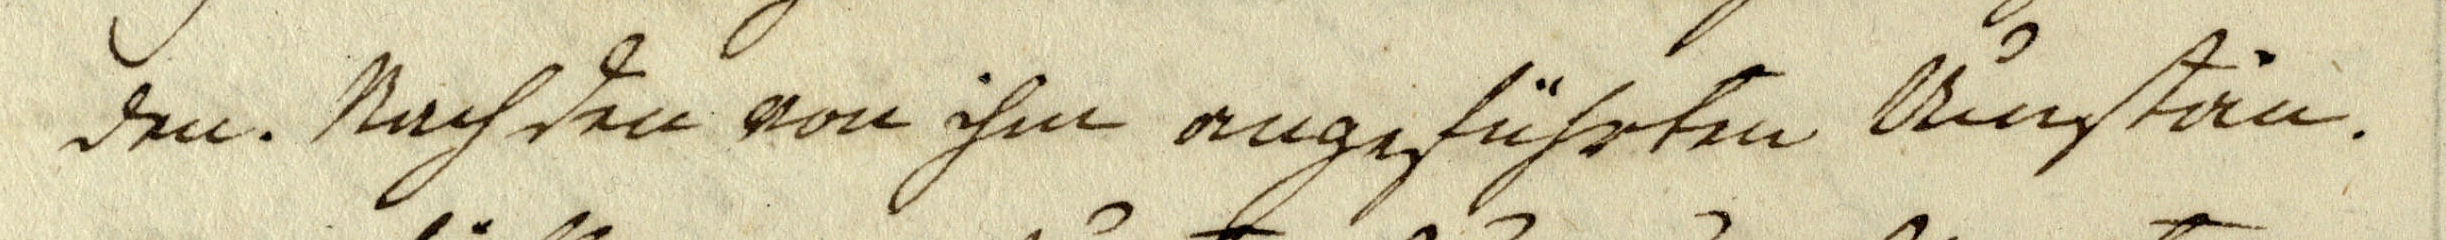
den. Nach den von ihm angeführten Umstän¬
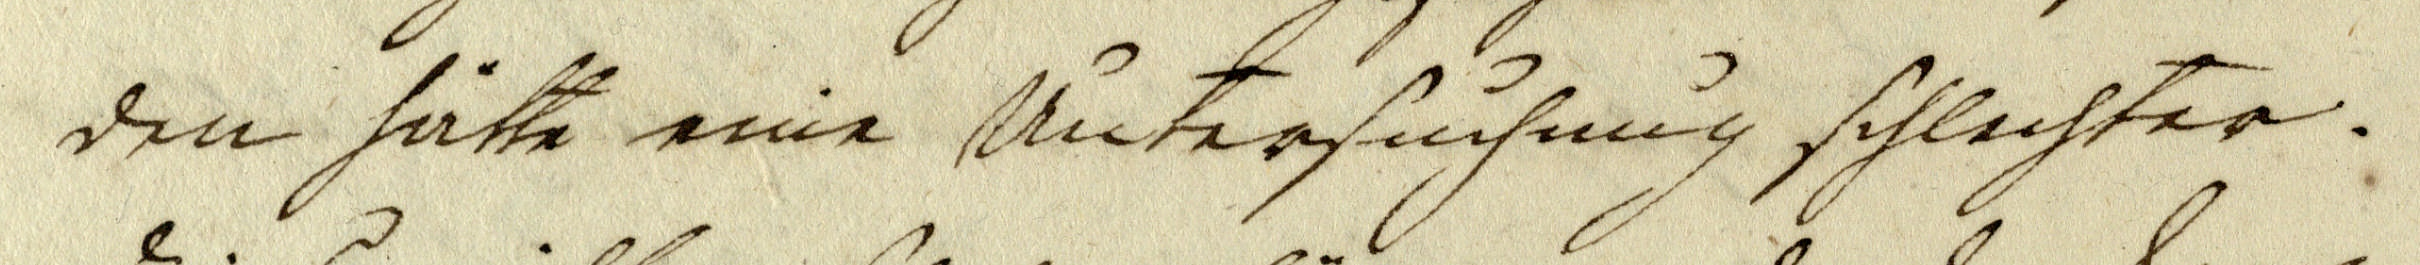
den hätte eine Untersuchung schlechter¬
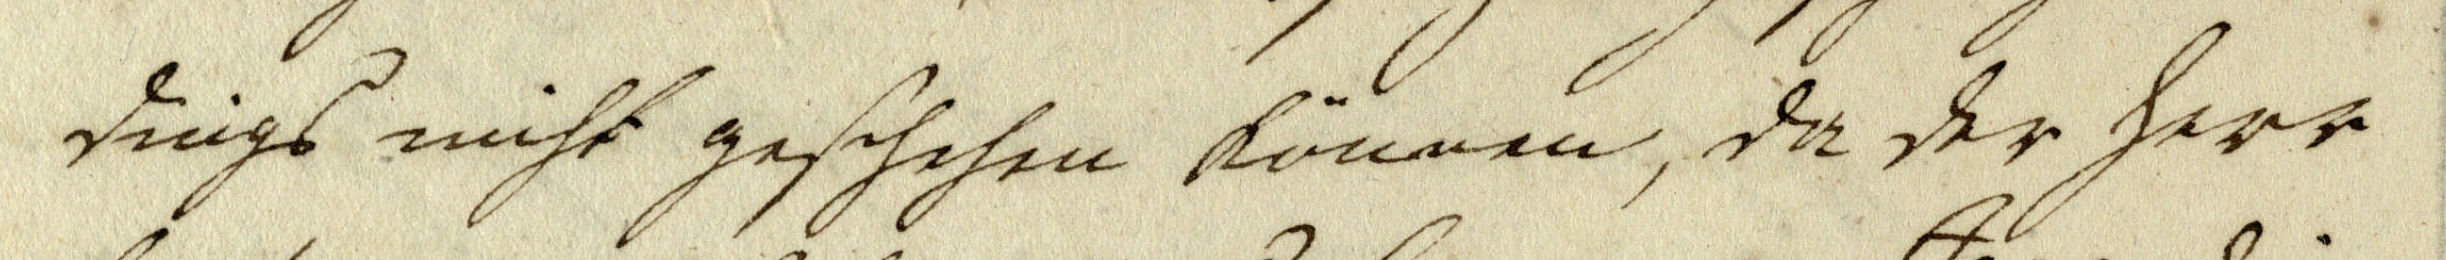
dings nicht geschehen können, da der Herr
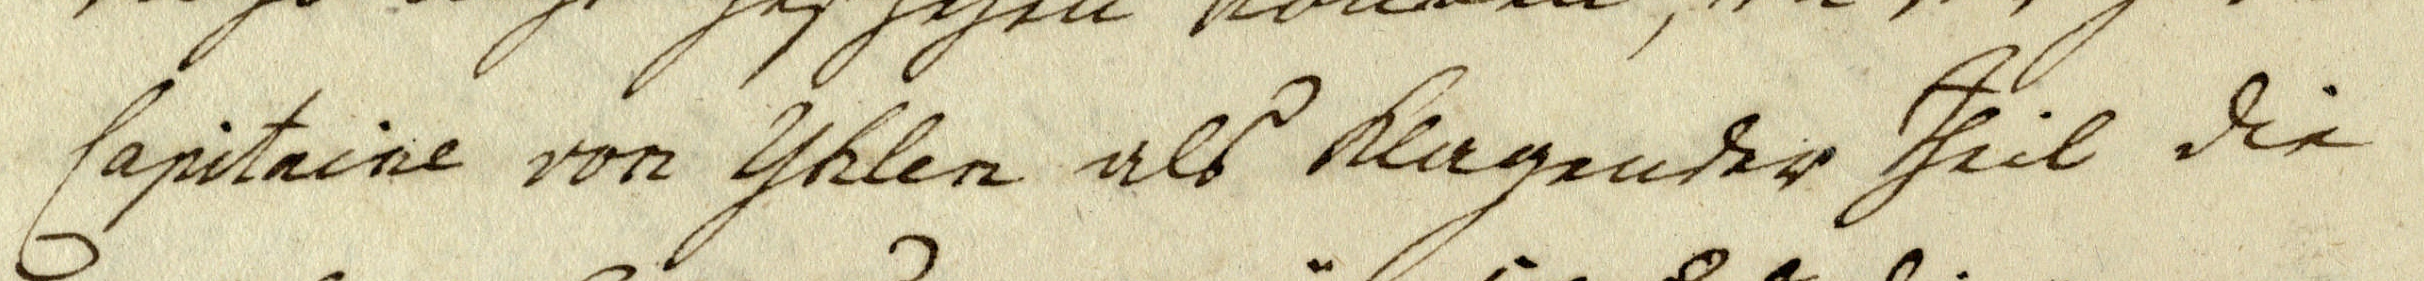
Capitaine von Ÿhlen als Klagender Theil die
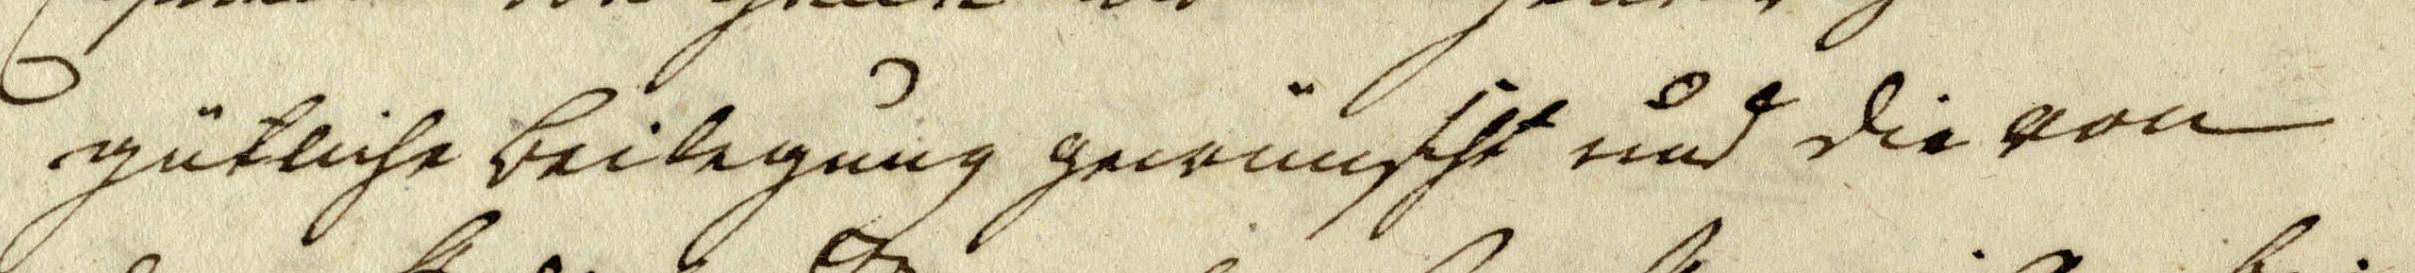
gütliche Beilegung gewünscht und die von
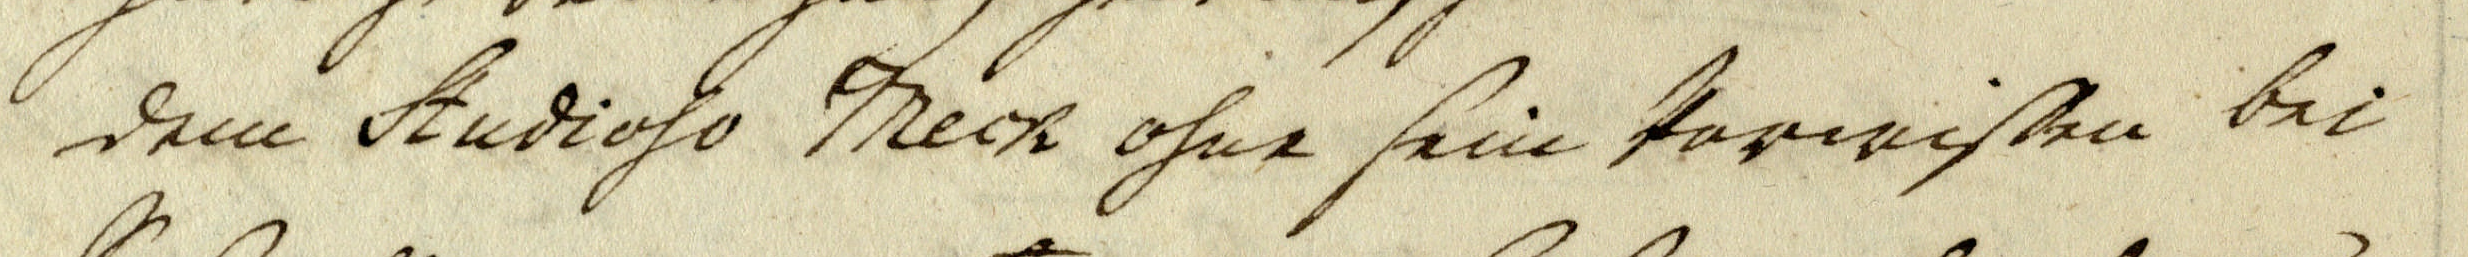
dem Studioso Meck ohne sein Vorwissen bei
